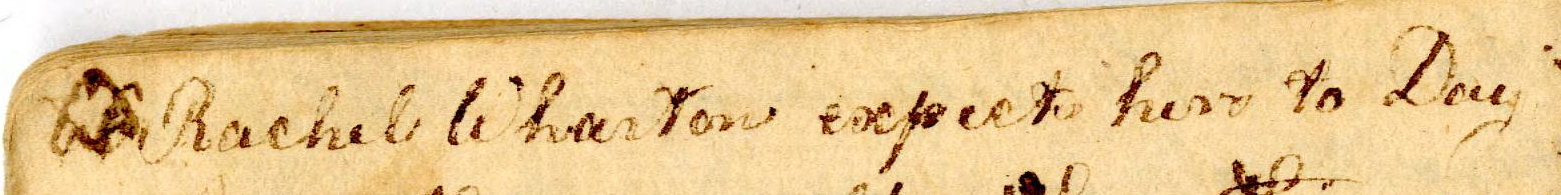66 Rachel Wharton expects hers to Day
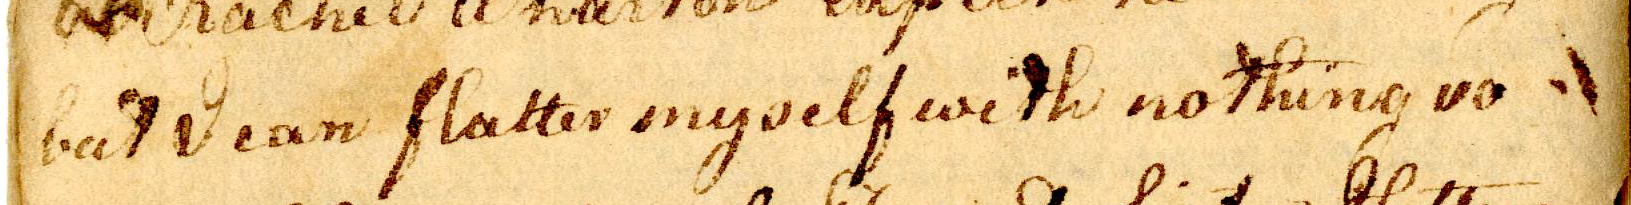but I can flatter myself with nothing so
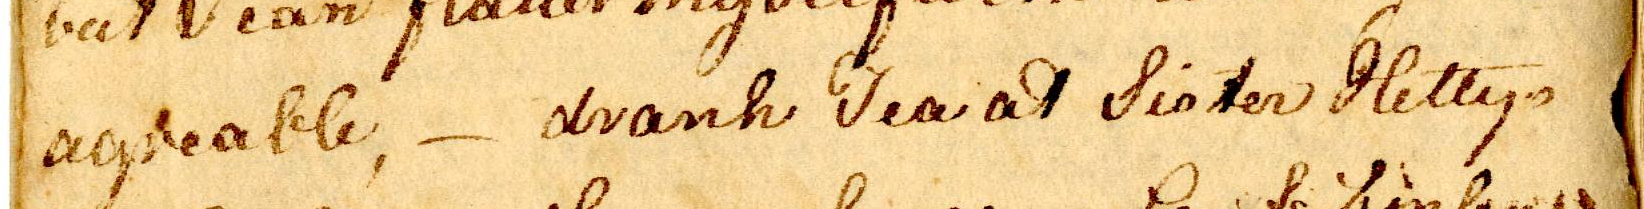agreable- drank Tea at Sister Hettys
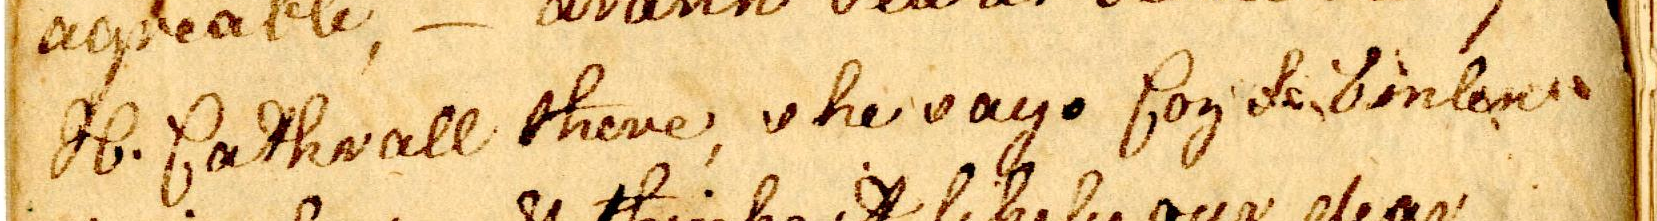H. Cathrall there, she says Coz S Emlen
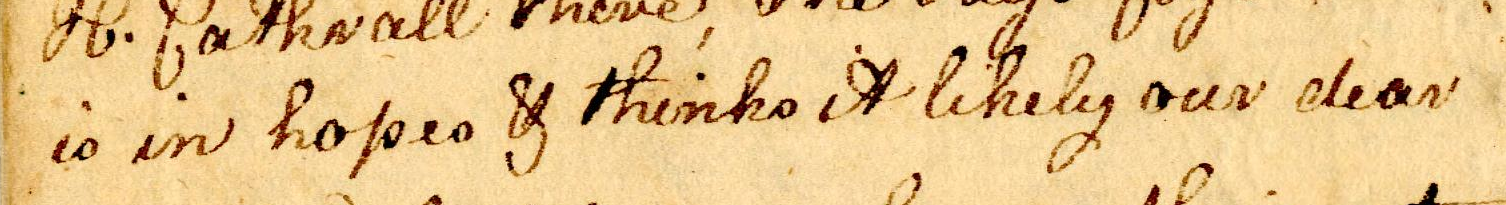is in hopes & thinks it likely our dear
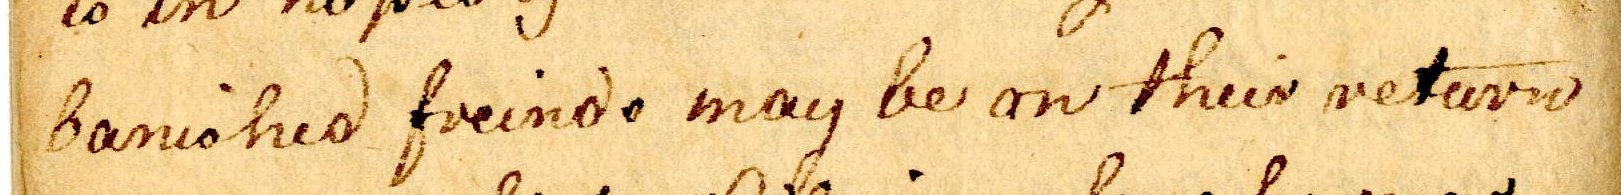banished freinds may be on their return
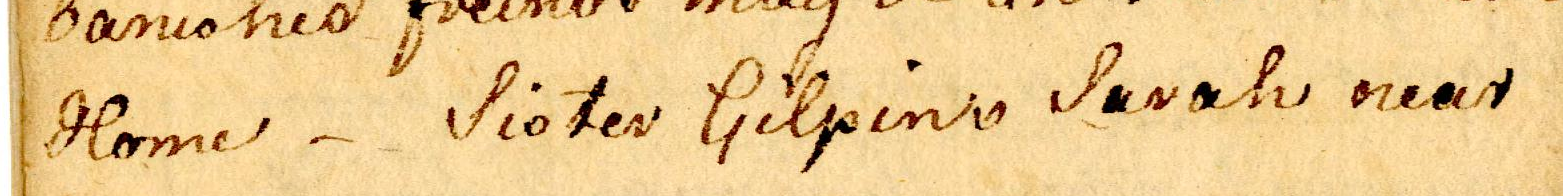Home- Sister Gilpins Sarah near
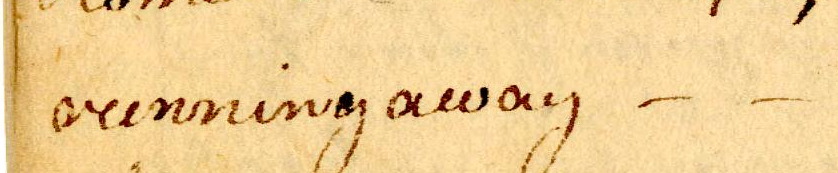running away-
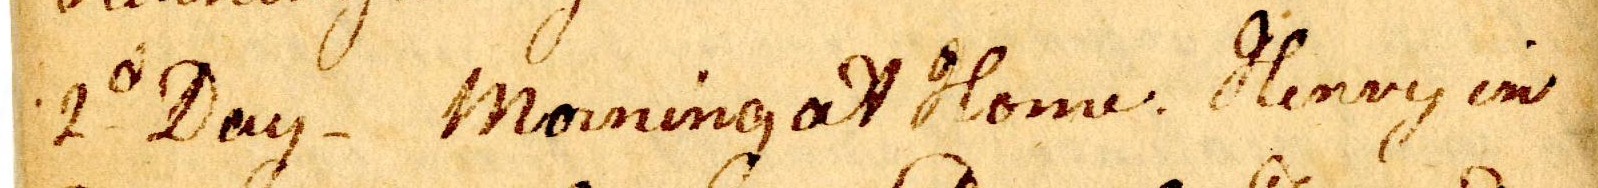2^d Day- Morning at Home. Henry in
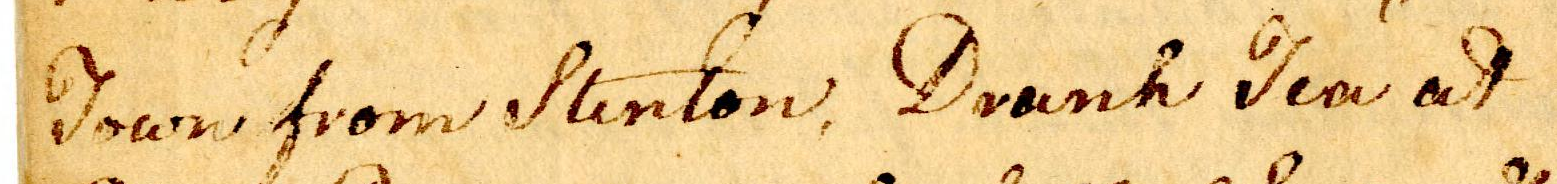Town from Stenton, Drank Tea at
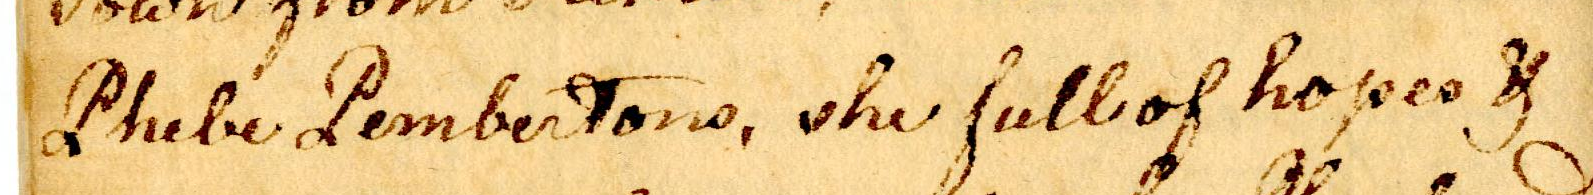Phebe Pembertons, she full of hopes &
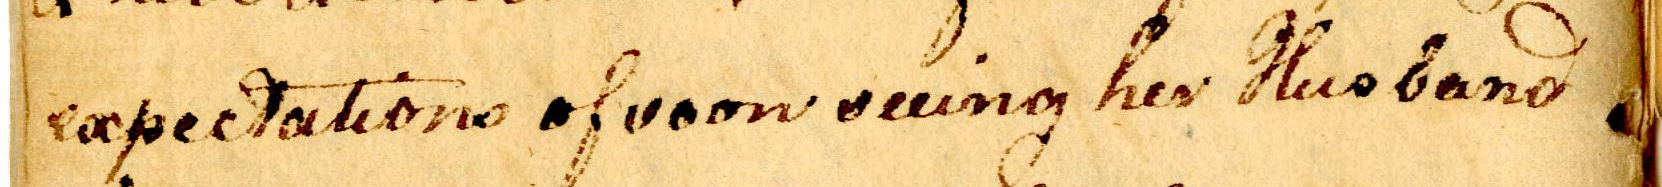expectations of soon seeing her Husband
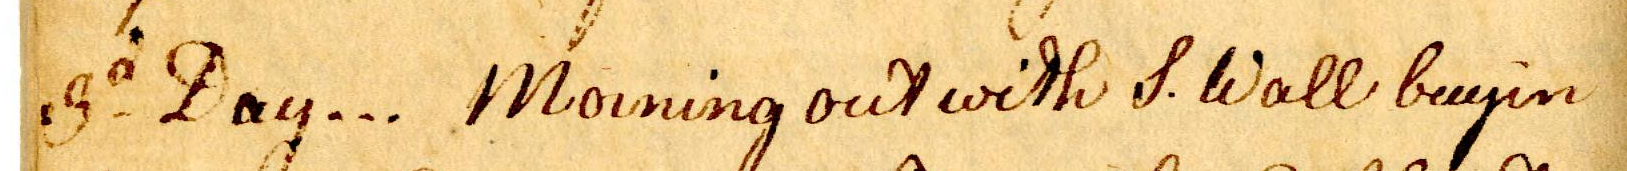3^d. Day... Morning out with S. Wall buyin
